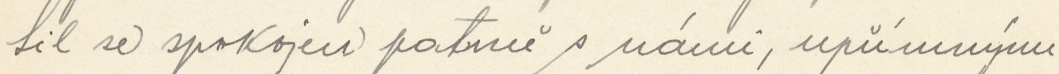til se spokojen patrně s námi, upřímnými
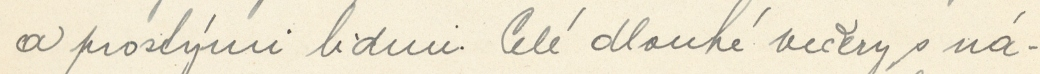a prostými lidmi. Celé dlouhé večery s ná-
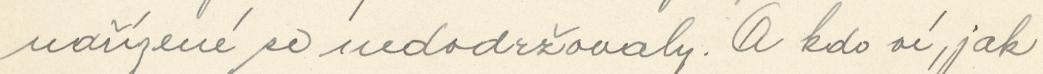nařízení se nedodržovaly. A kdo ví, jak
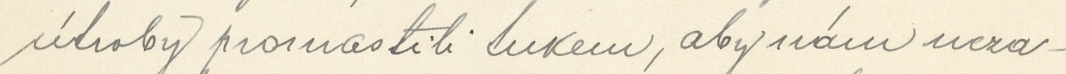útroby promastili tukem, aby nám neza-
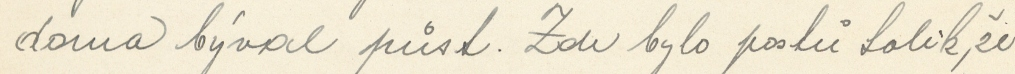doma býval půst. Zde bylo postů tolik, že
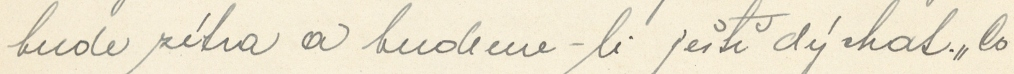bude zítra a budeme-li ještě dýchat. „Co
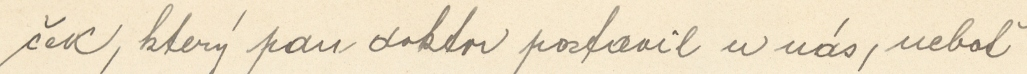ček, který pan doktor postavil u nás, neboť
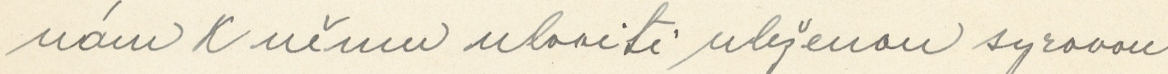nám k němu uloviti uleženou syrovou
